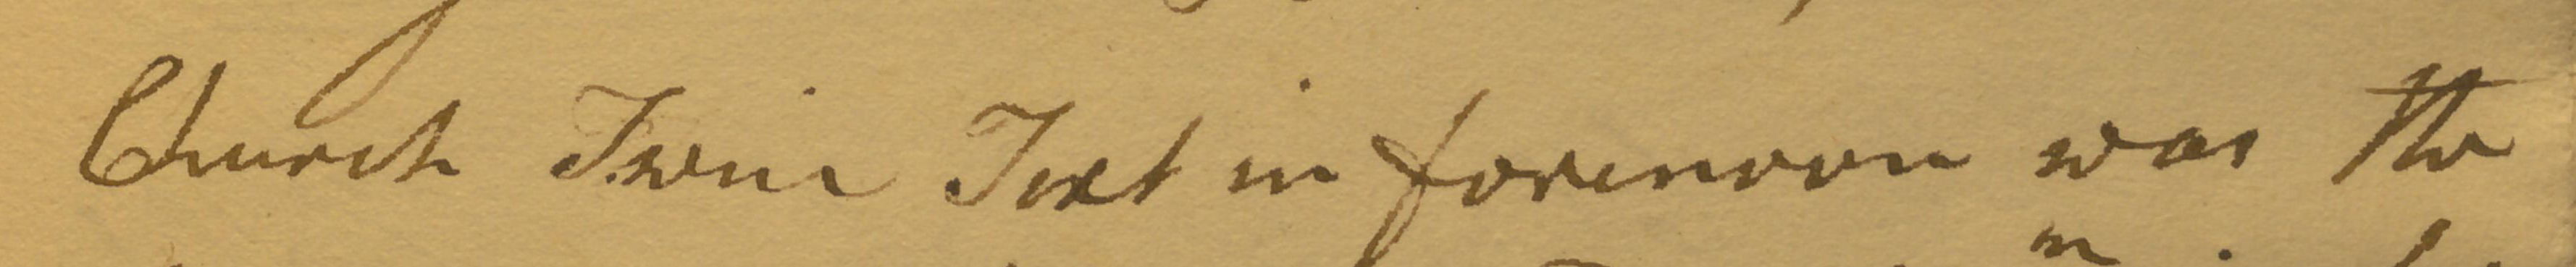Church Twice Text in forenoon was the
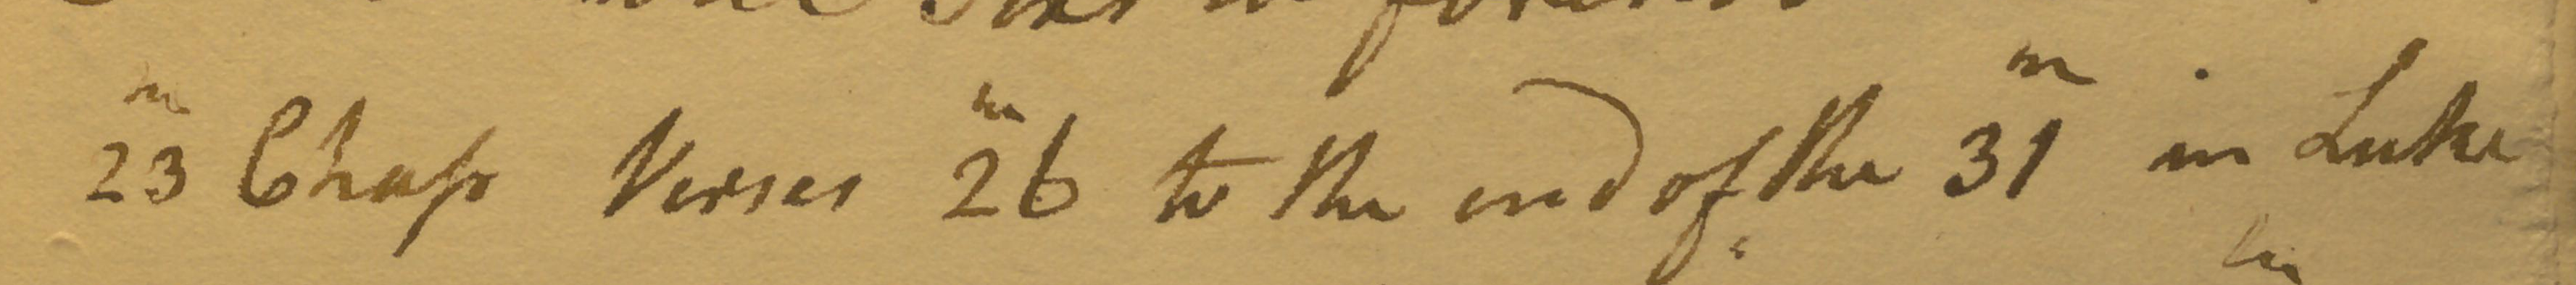23^th Chap Verses 26^th to the and of the 31^th an Luke
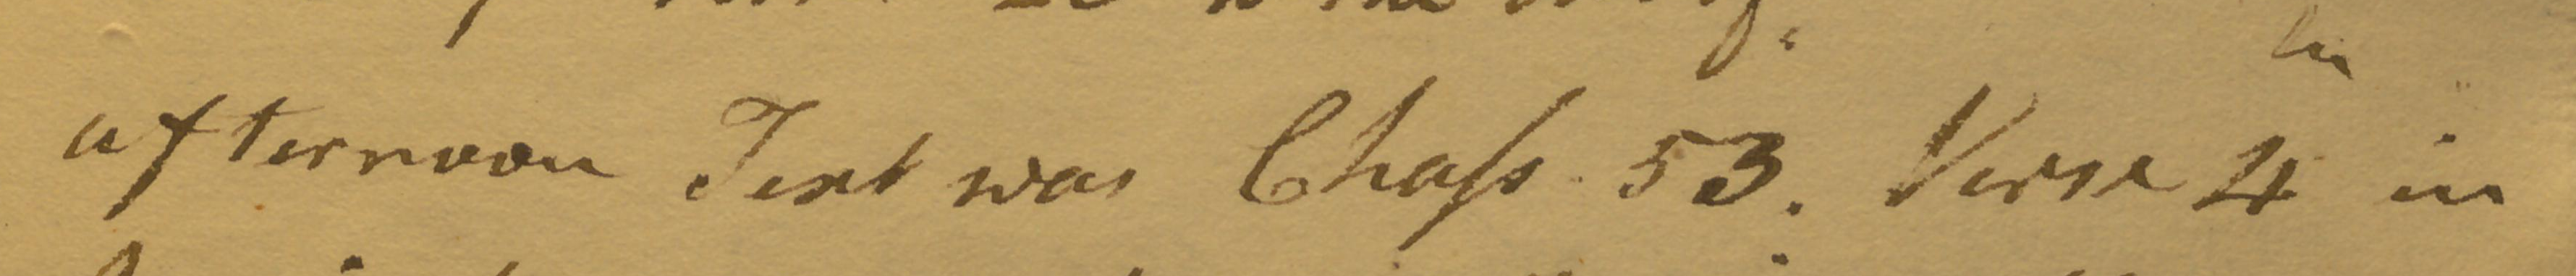afternoon Text was Chap 53. Verse 4^th in
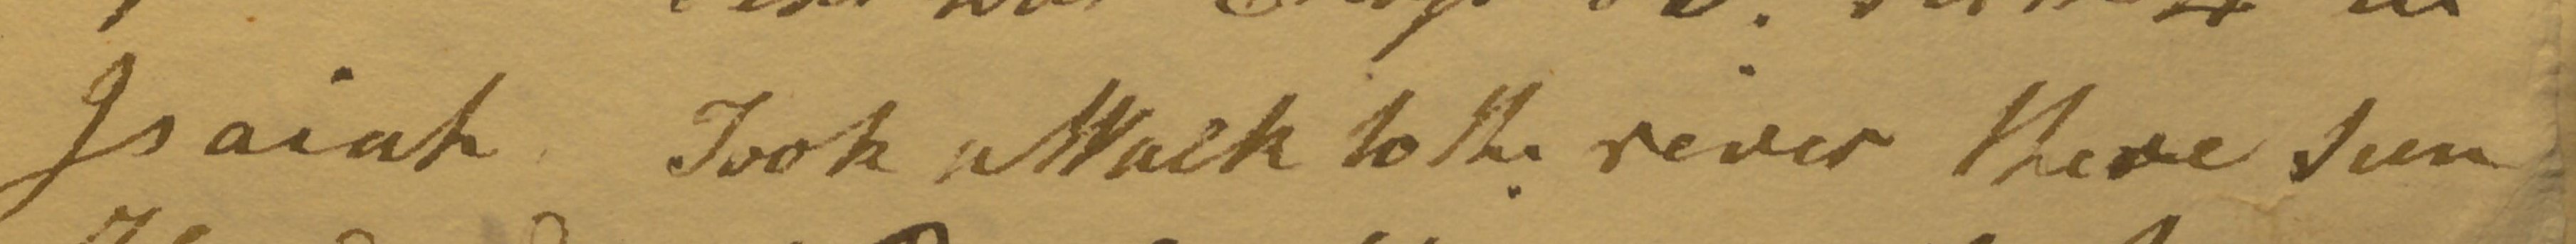Isaiah. Took a Walk to the river there seen
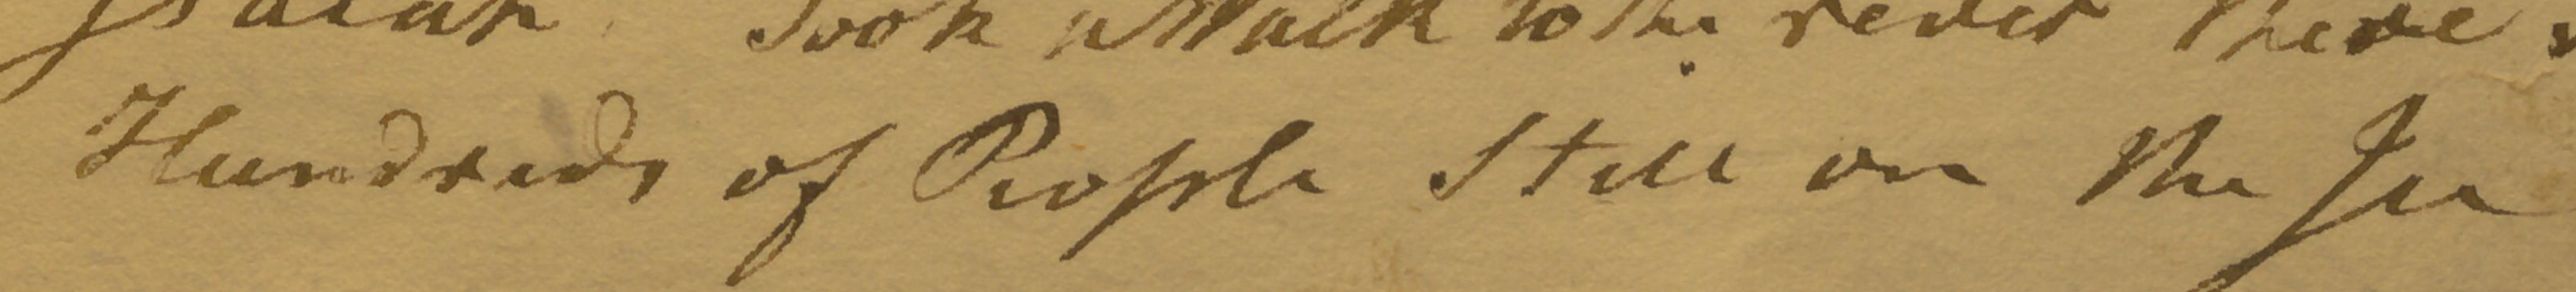Hundreds of People Still on the Ice
